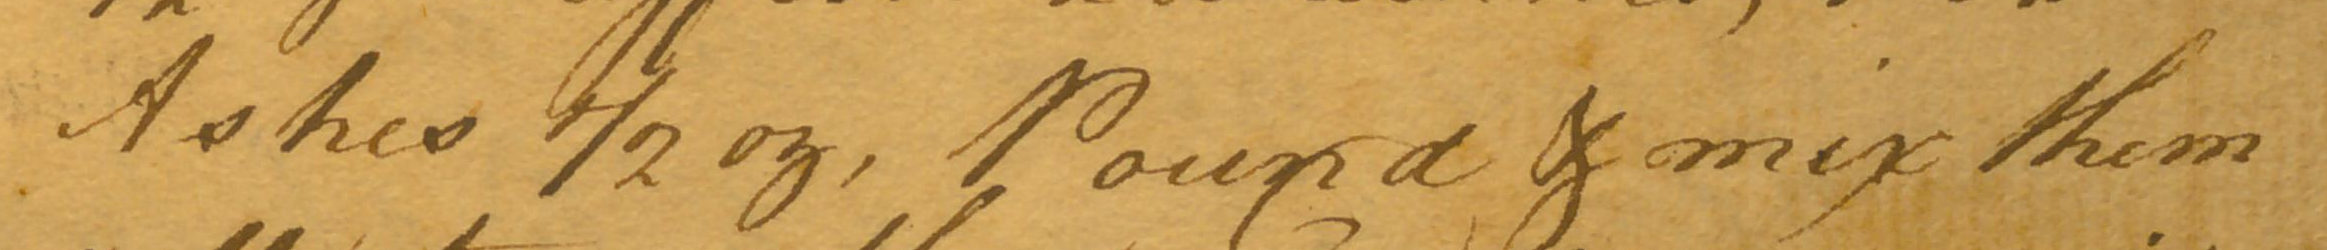Ashes 1/2 oz, Pound & mix them
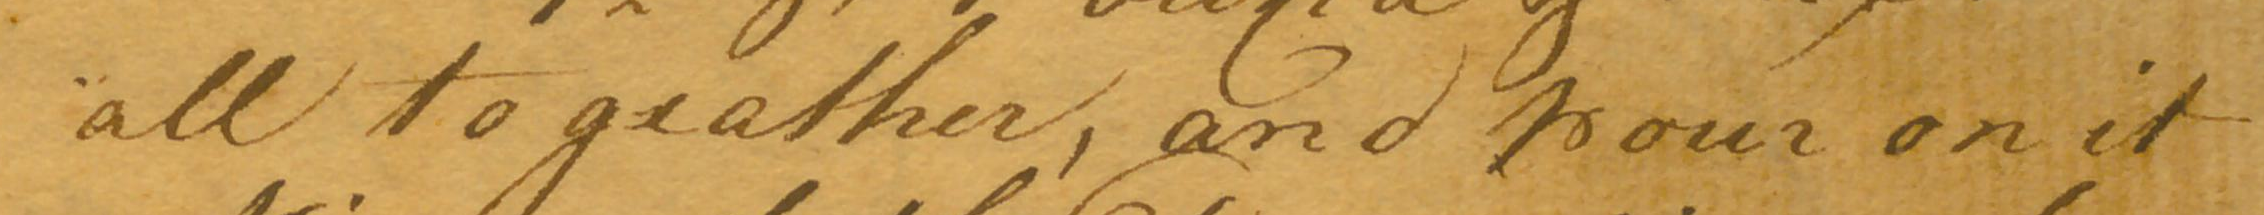all together, and pour on it
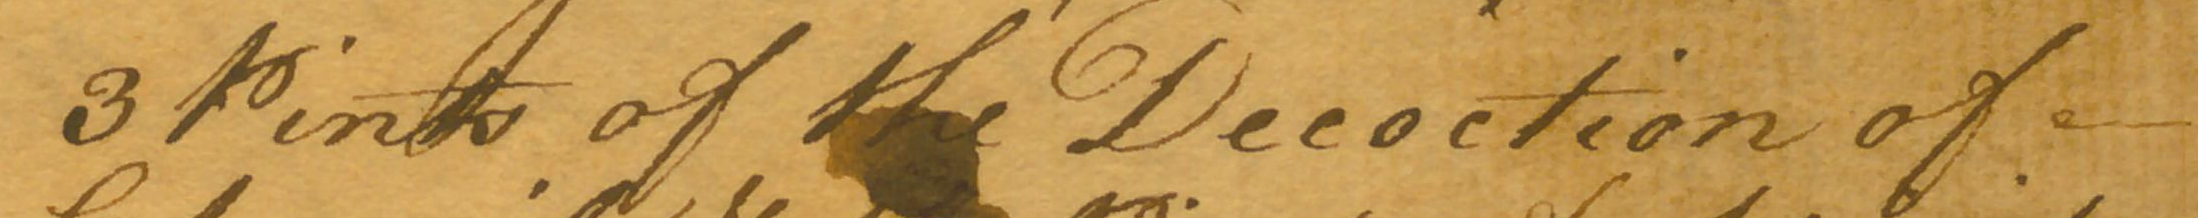3 Pints of the Decoction of
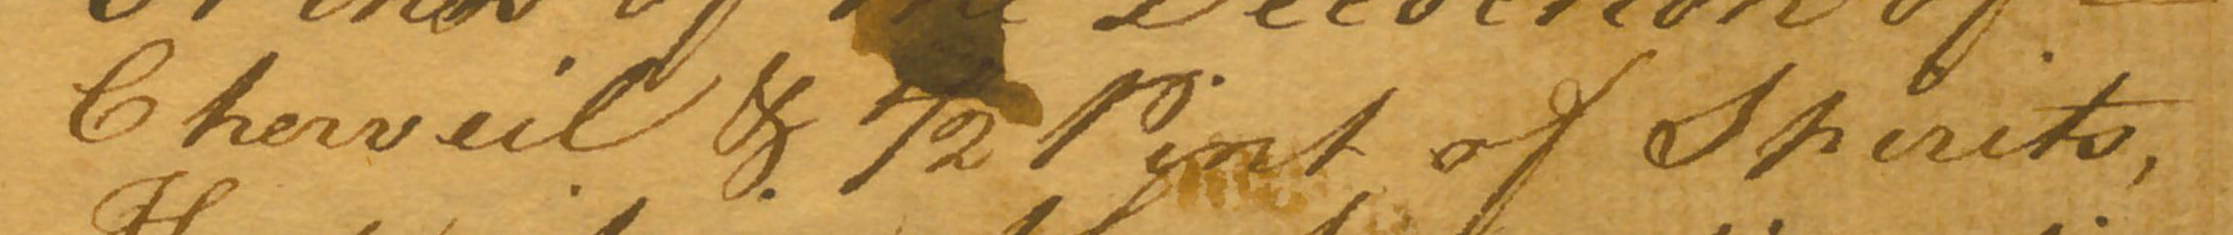Cherveil & 1/2 Pint of Spirits,
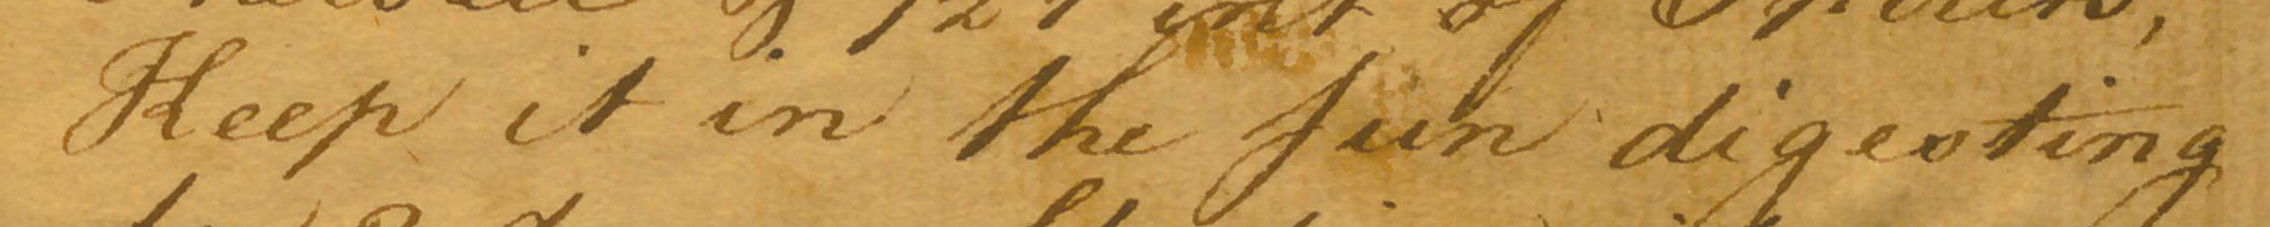Keep it in the sun digesting
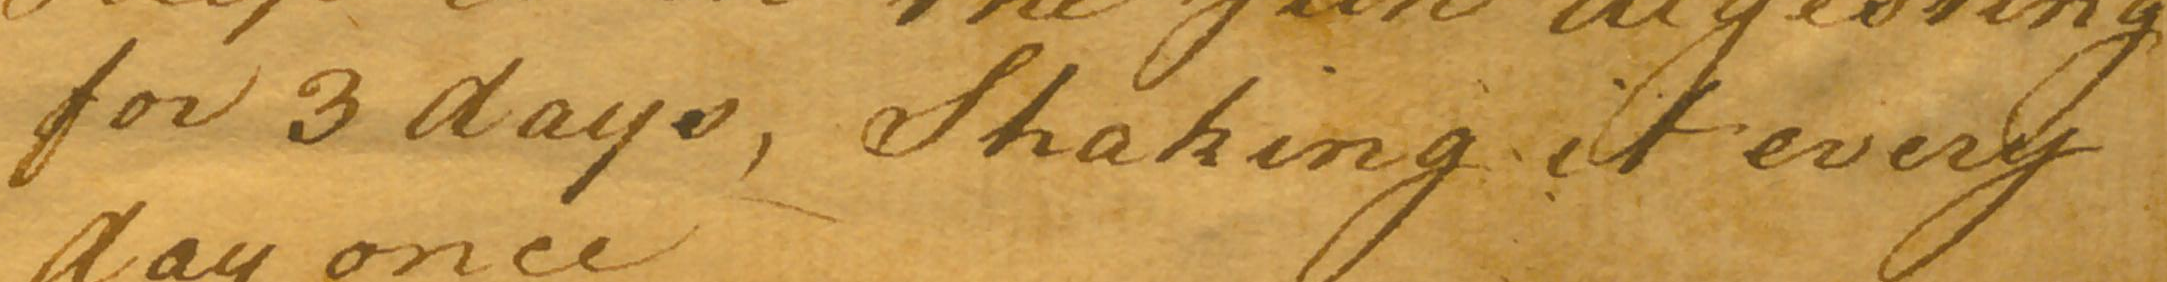for 3 days, Shaking it every
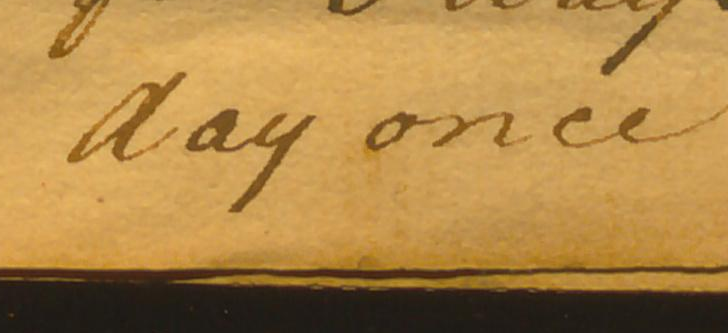day once
